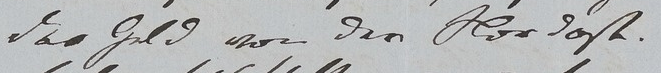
das Geld von der Nordost-
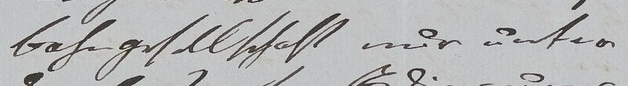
bahngesellschaft nur unter
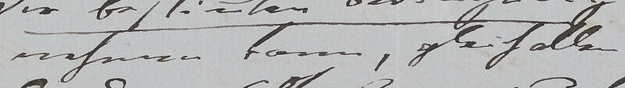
nehmen kann, gleich allen
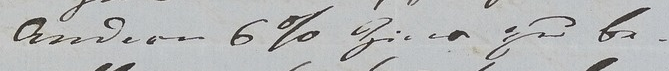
Anderen 6% Zins zu be-
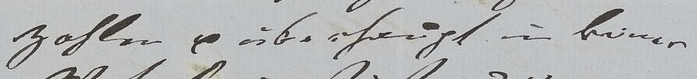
zahlen & überhaupt in keiner
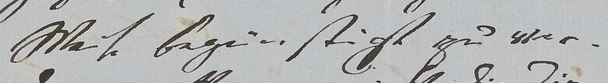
Weise begünstigt zu wer-
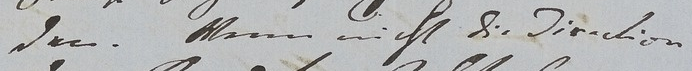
den. Wenn nicht die Direction
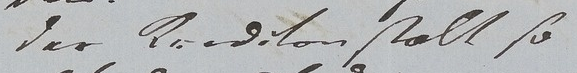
der Kreditanstalt so
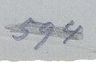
würde,
